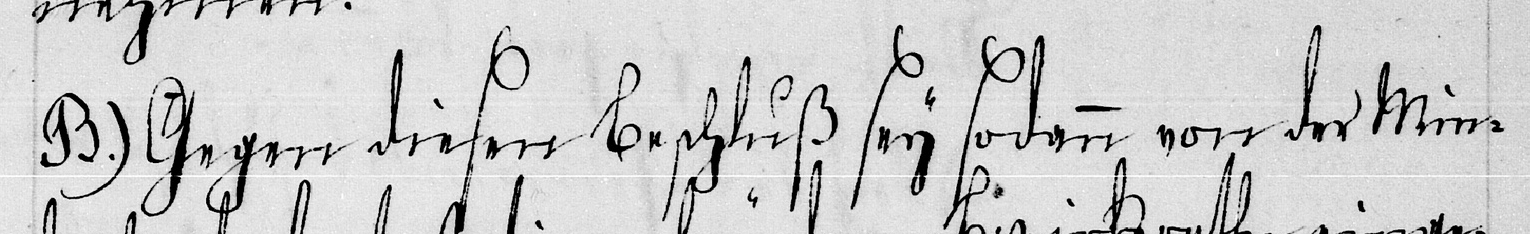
B.) Gegen diesen Beschluß sey sodann von der Min¬
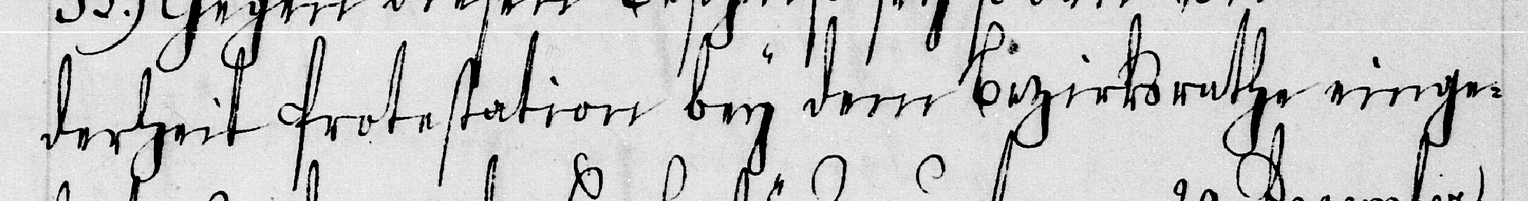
derheit Protestation bey dem Bezirksrathe einge¬
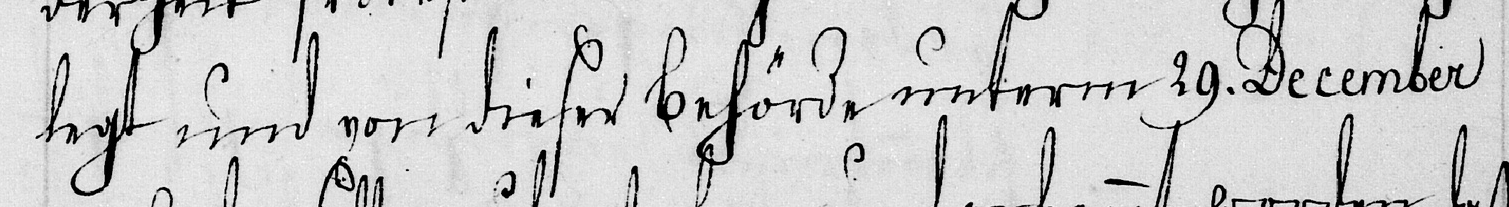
legt und von dieser Behörde unterm 29. December
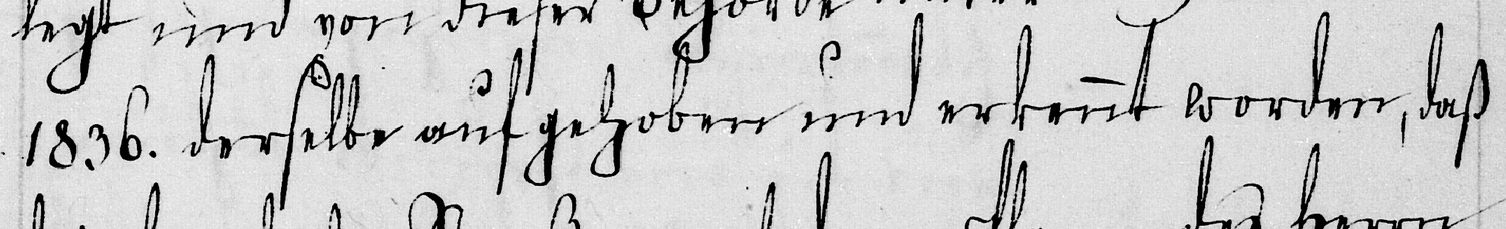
1836. derselbe aufgehoben und erkennt worden, daß
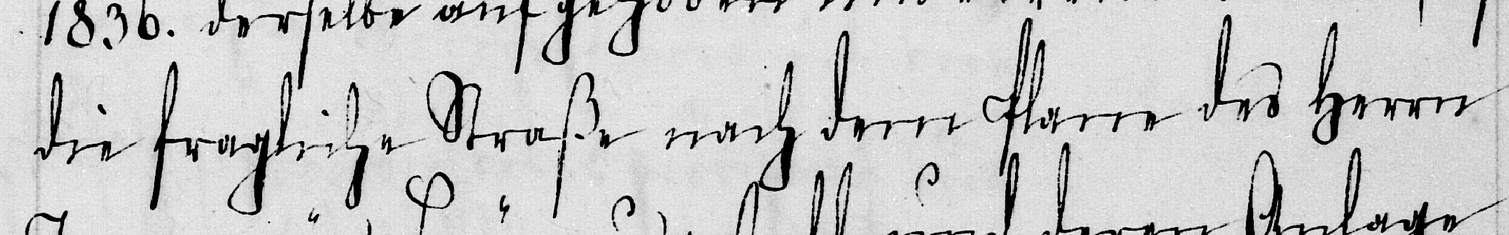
die fragliche Straße nach dem Plan des Herrn
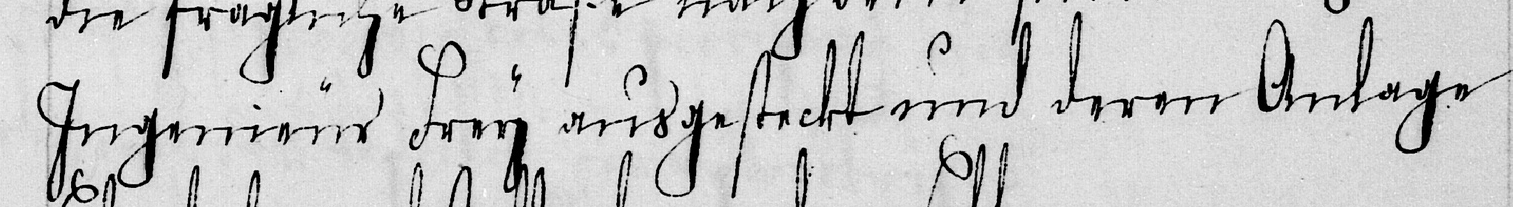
Ingenieur Frey ausgesteckt und deren Anlage
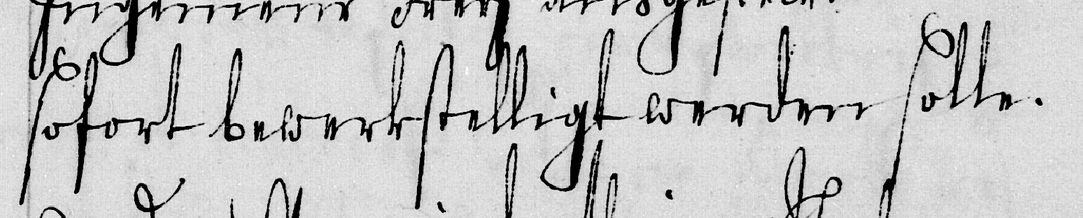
sofort bewerkstelligt werden solle.
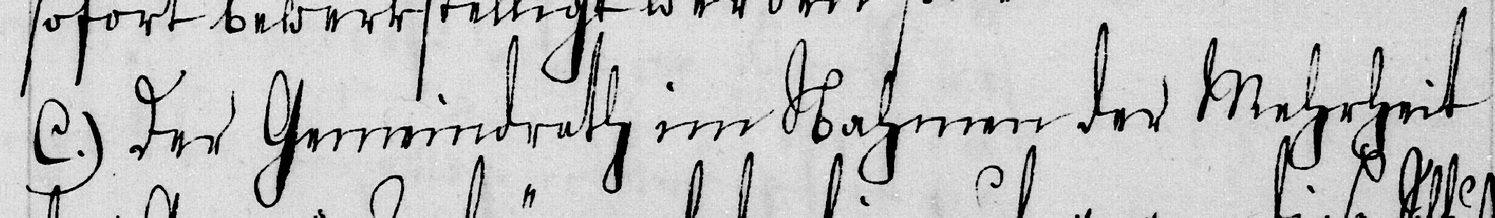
C.) Der Gemeindrath im Nahmen der Mehrheit
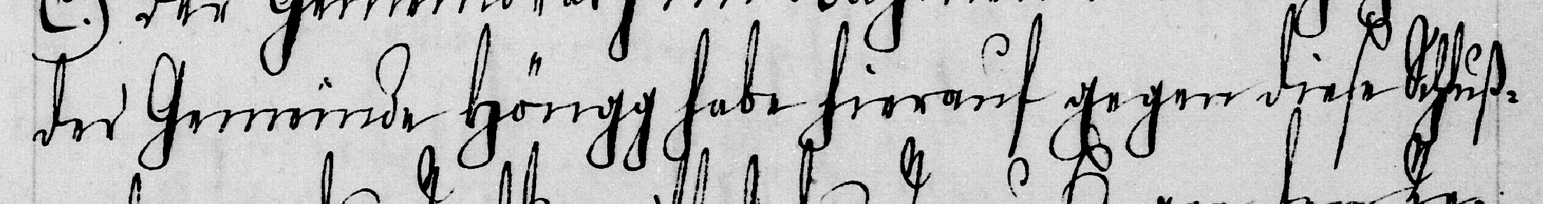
der Gemeinde Höngg habe hierauf gegen diese Sch¬
